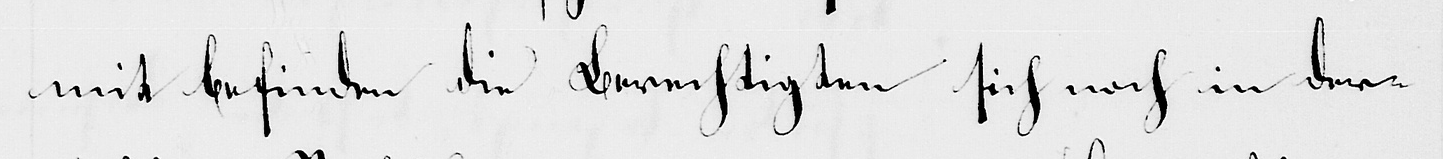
mit befinden die Berechtigten sich noch in der¬
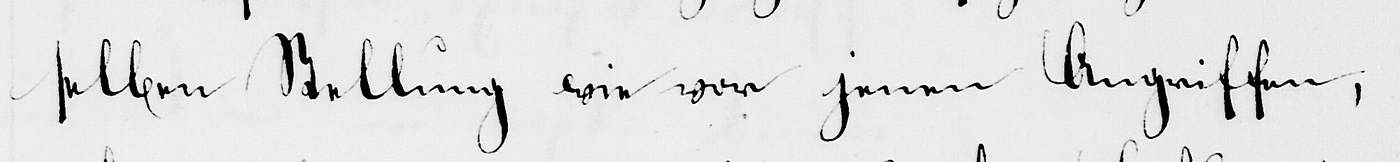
selben Stellung wie vor jenen Angriffen;
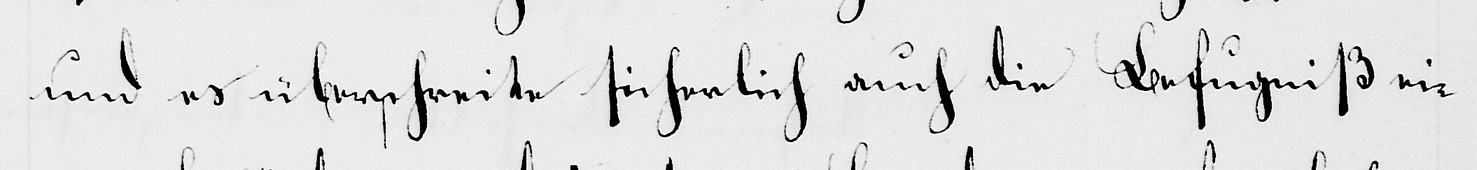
und es überschreite sicherlich auch die Befugniß ei¬
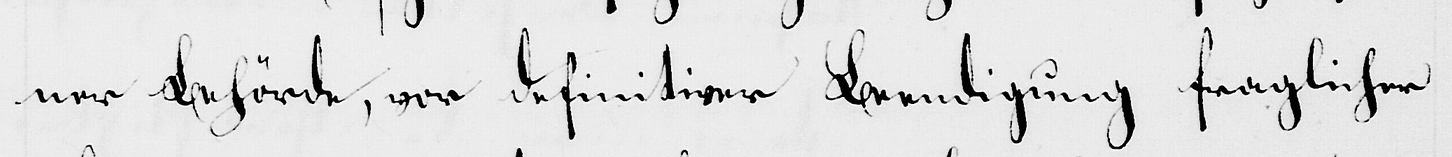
ner Behörde, vor definitiver Beendigung fraglicher
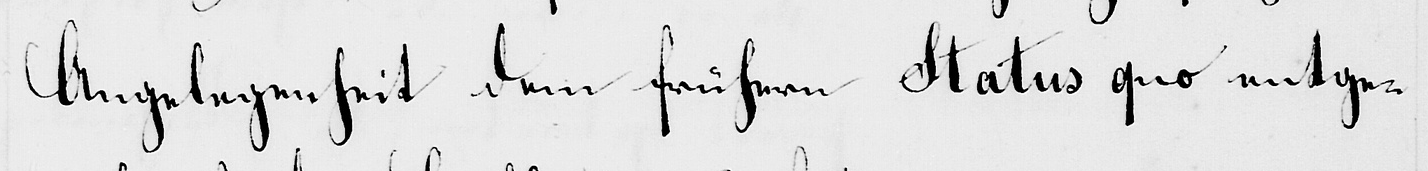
Angelegenheit dem frühern Status quo entge¬
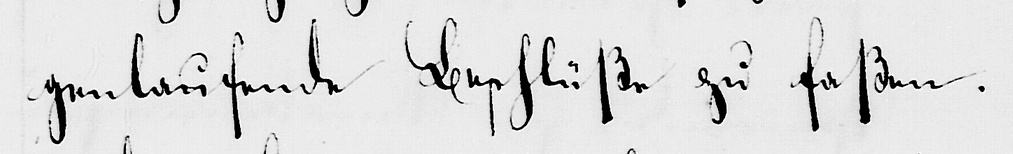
genlaufende Beschlüße zu faßen.
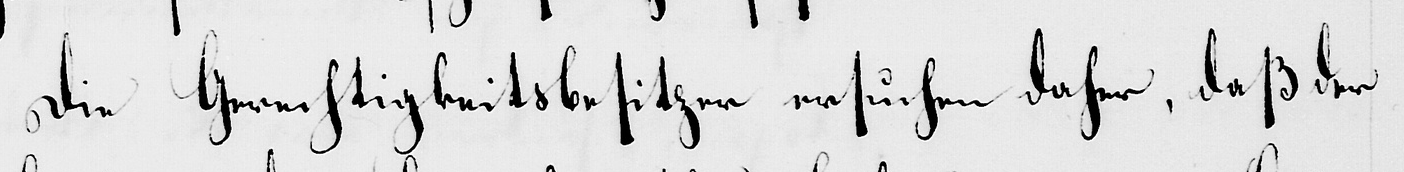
Die Gerechtigkeitsbesitzer ersuchen daher, daß der
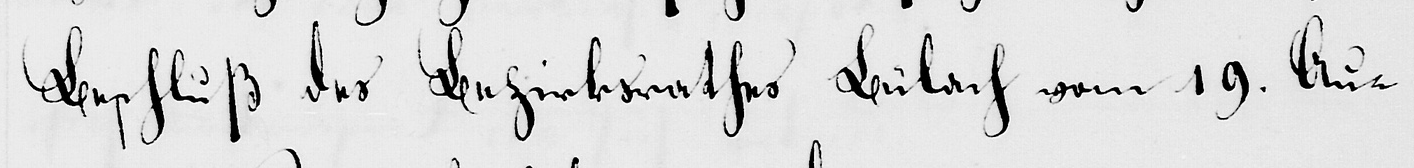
Beschluß des Bezirksrathes Bülach vom 19. Au¬
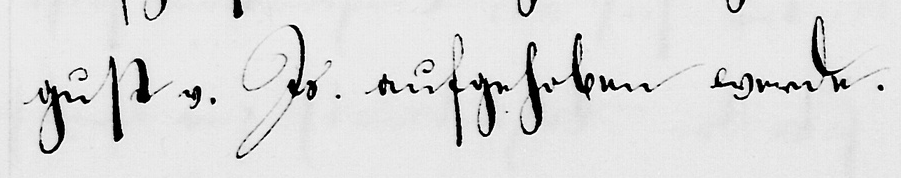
gust v. Js. aufgehoben werde.
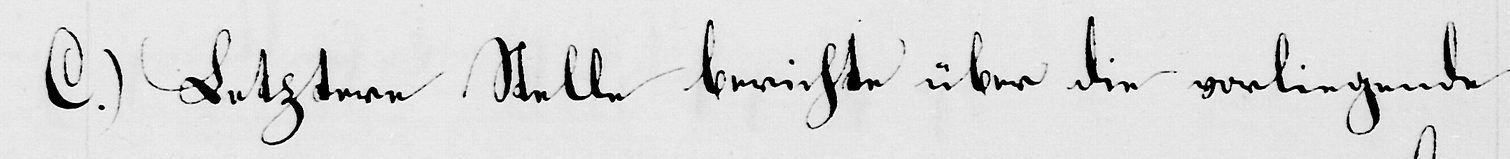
C.) Letztere Stelle berichte über die vorliegende
